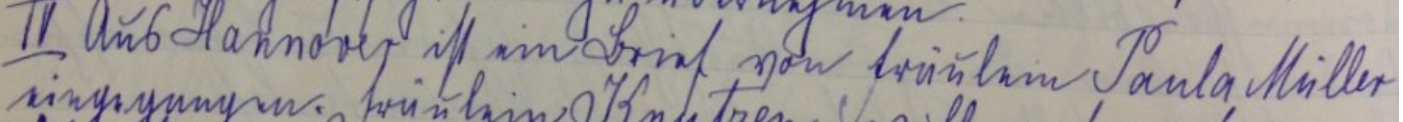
IV Aus Hannover ist ein Brief von Fräulein Paula Müller
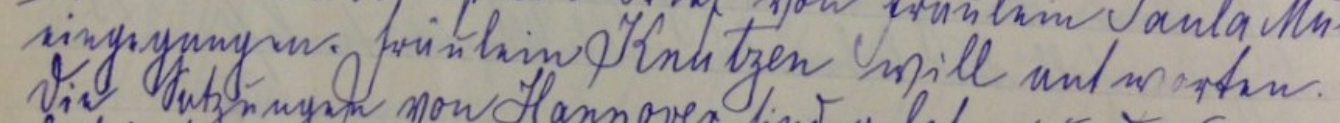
eingegangen. Fäulein Knutzen will antworten.
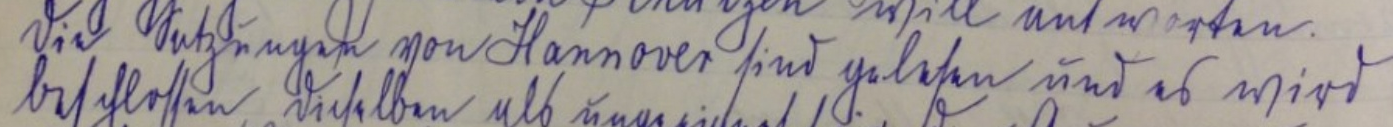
Die Satzungen von Hannover sind gelesen und es wird
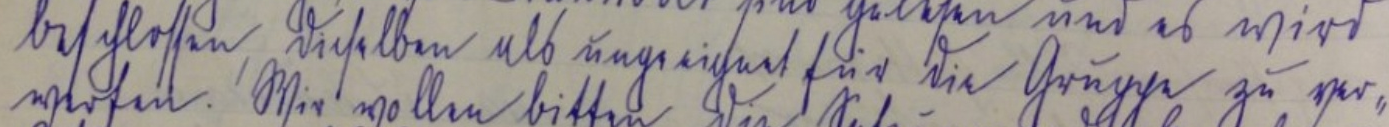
beschlossen dieselben als ungeeignet für die Gruppe zu ver
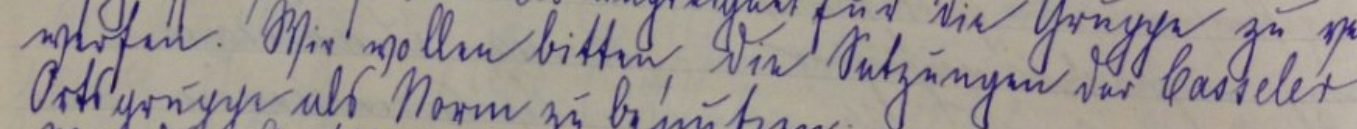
werfen. Wir wollen bitten die Satzungen der Casseler
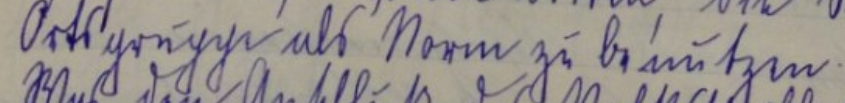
Ortsgruppe als Norm zu benutzen.
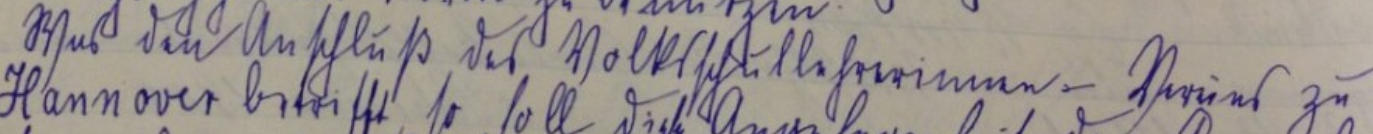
Was den Anschluß des Volksschulleherinnen-Vereins zu
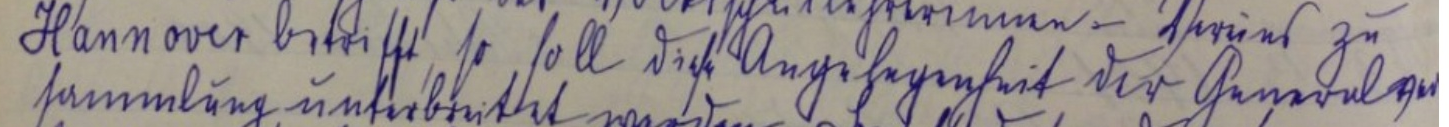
Hannover betrifft, so soll diese Angelegenheit der Gerneralver
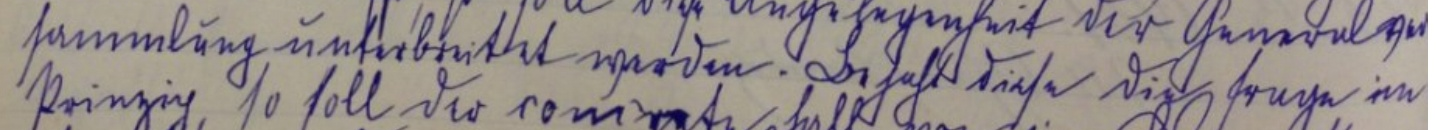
sammlung unterbreitet werden. Bejaht diese die Frage
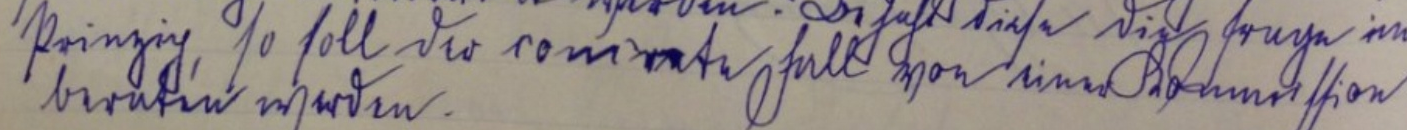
im Prinzip so soll der concrete Fall von einer Kommission
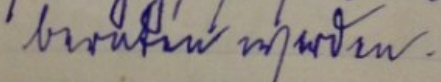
beraten werden.
